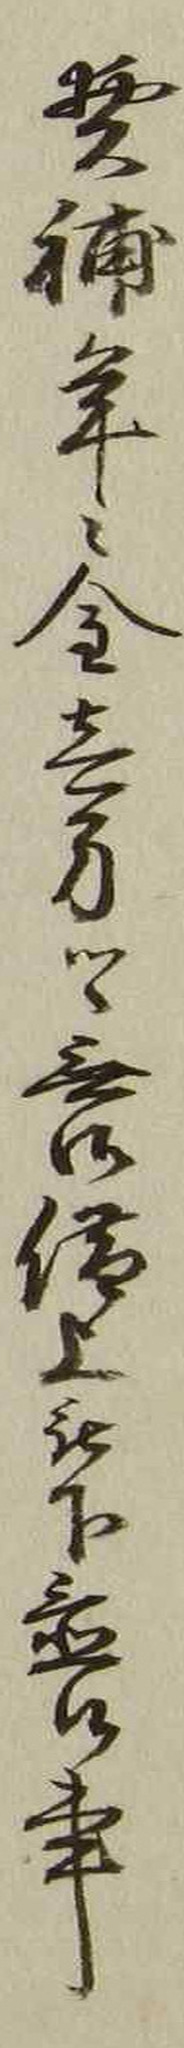費補年々金壱分ツヽ無御借上被下置候事
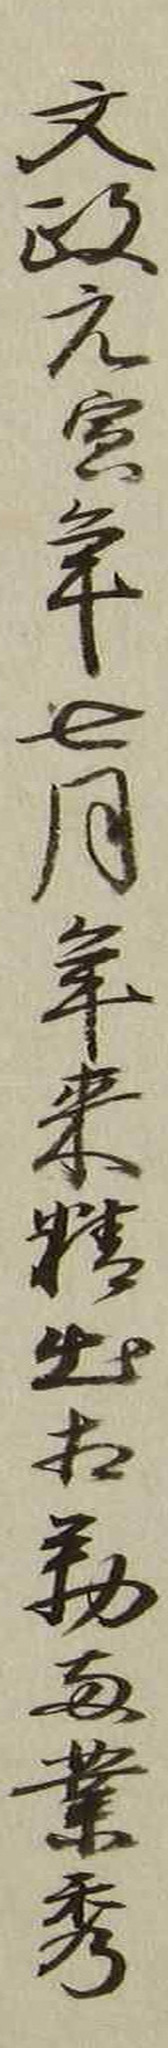一文政元寅年七月年来精出相勤両業秀
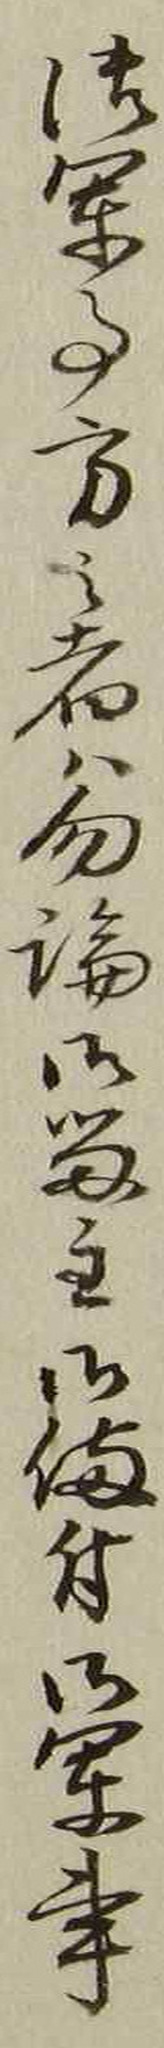御軍事方之者ハ勿論御留主御備付御軍事
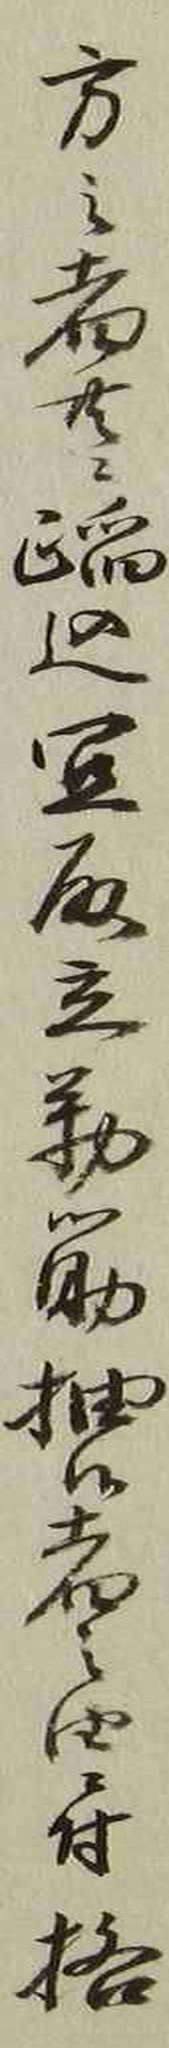方之者共ニ蹈込宜取立勤筋抽候者之由ニ付格
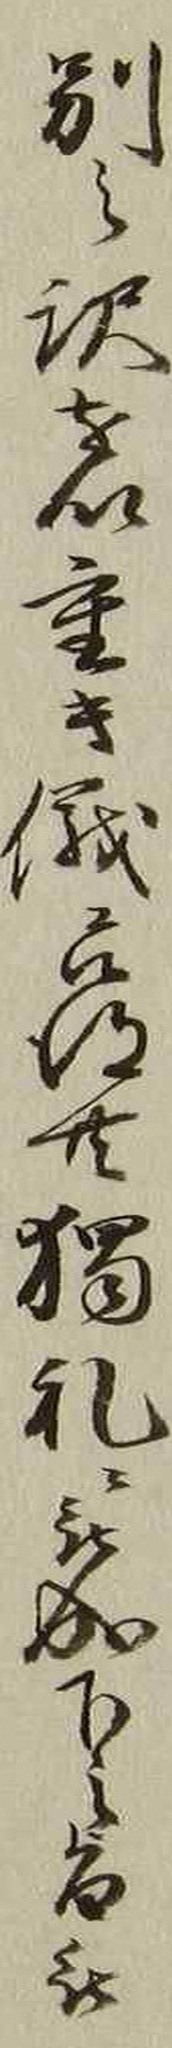別之訳を以重キ儀ニ候得共独礼ニ被成下之旨被
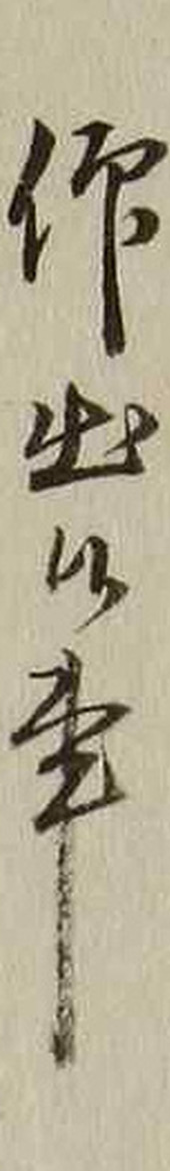仰出候事
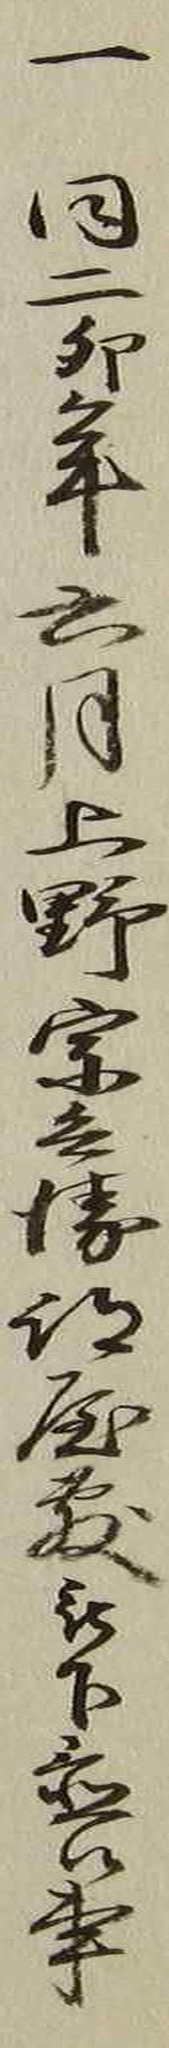一同二卯年六月上野宗兵衛跡屋敷被下置候事
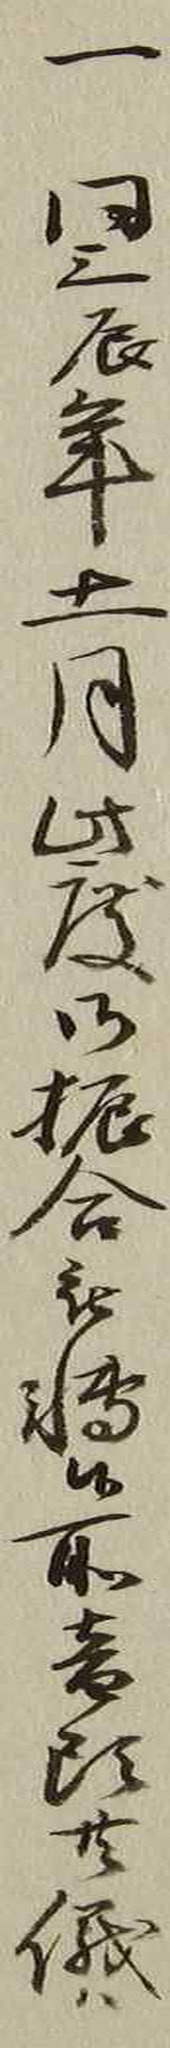一同三辰年十一月此度御振合被転候所音頭共儀ハ
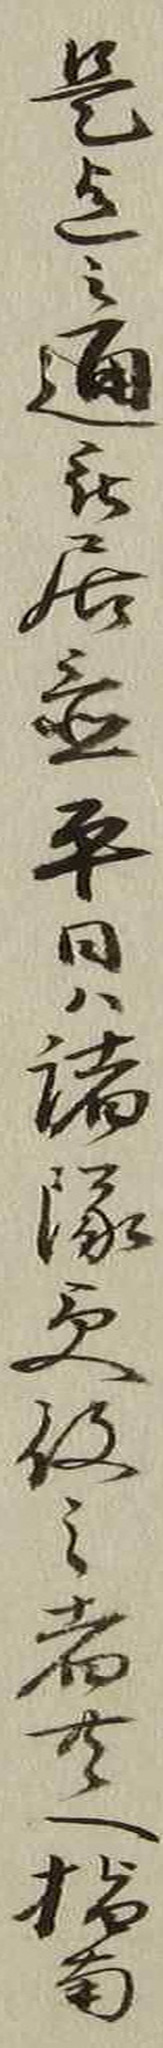是迄之通被居置平日ハ諸隊受役之者共へ指南
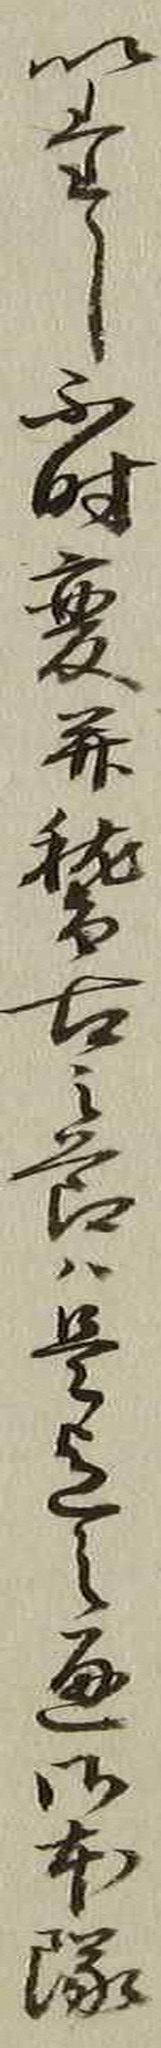いたし不時変并稽古之節ハ是迄之通御本隊
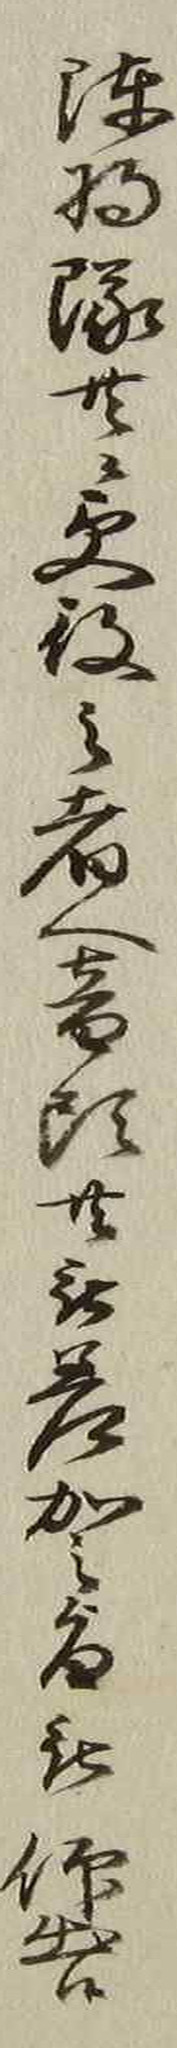陣将隊共ニ受役之者へ音頭共被差加之旨被仰出候
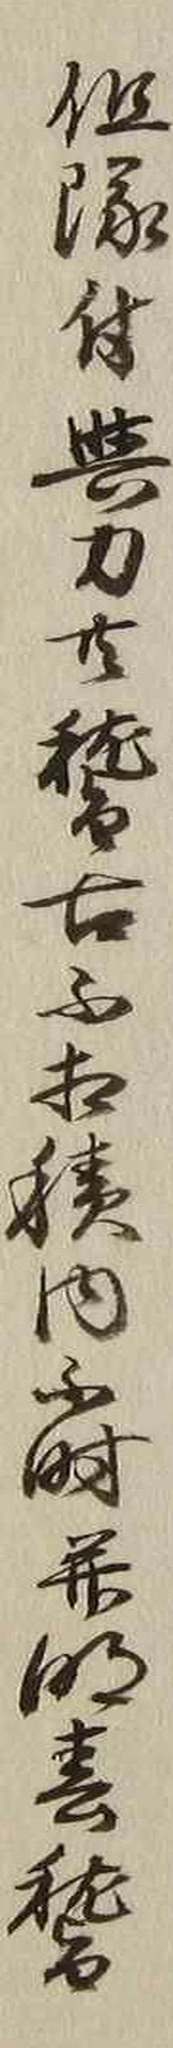但隊付与力共稽古不相積内不時并明春稽
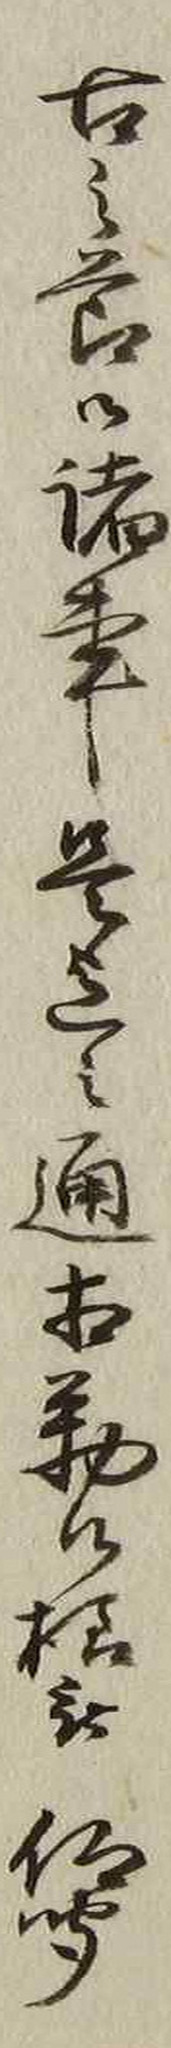古之節御諸事是迄之通相勤候様被仰聞
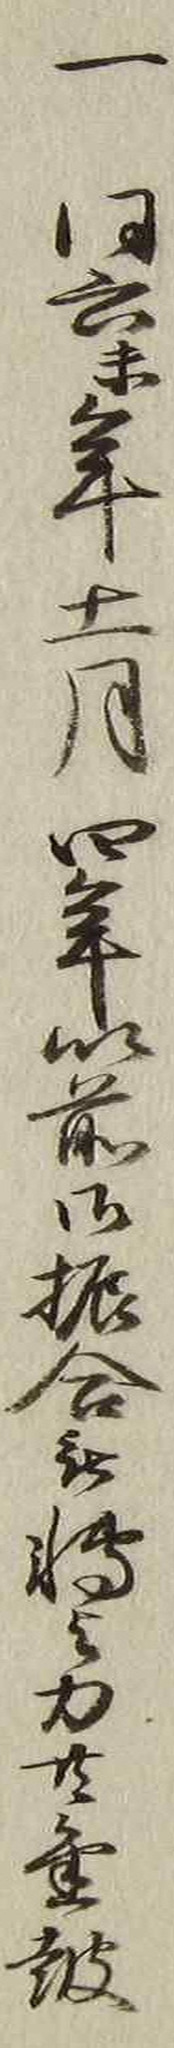一同六未年十一月四年以前御振合被転与力共金鼓
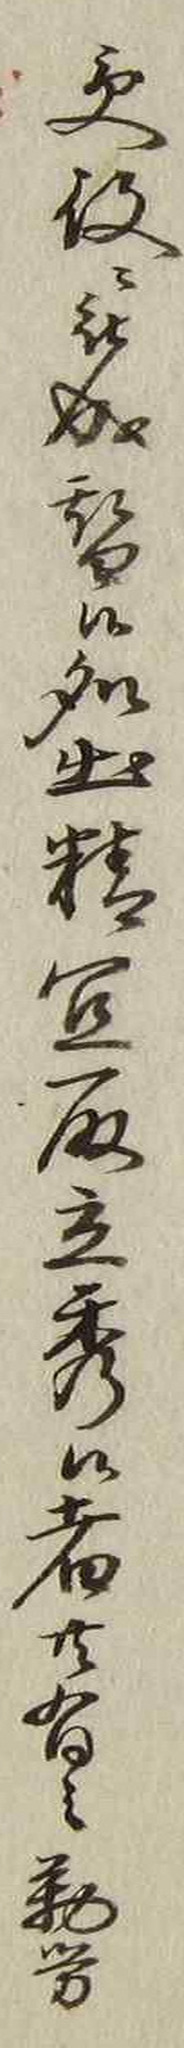受役ニ被成替候処出精宜取立秀候者共有之勤労
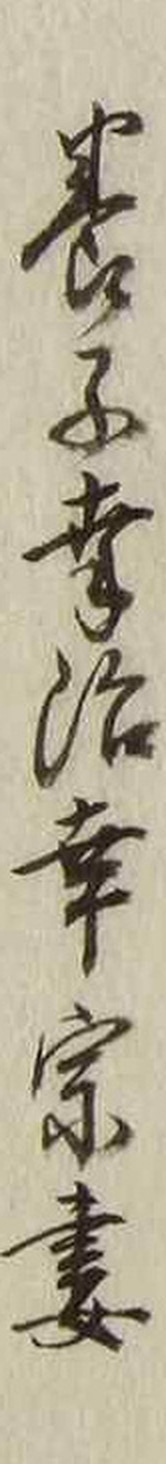女養子幸治幸宗妻
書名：諸士系譜　巻之102　か之部10
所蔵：会津若松市立会津図書館
